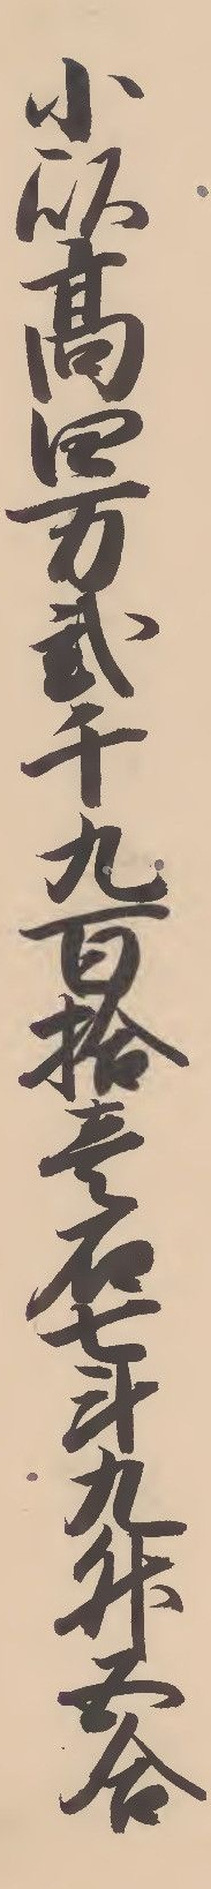小以高四万弐千九百拾壱石七斗九升五合

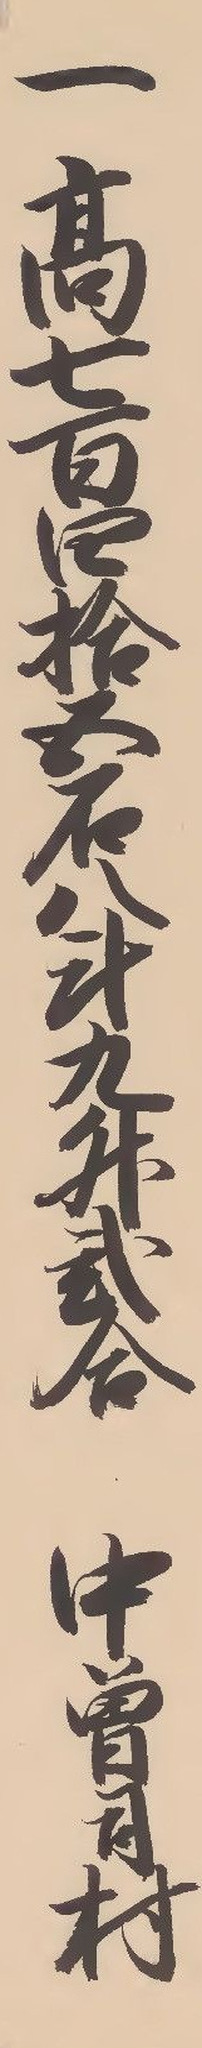一高七百四拾五石八斗九升弐合中曽司村
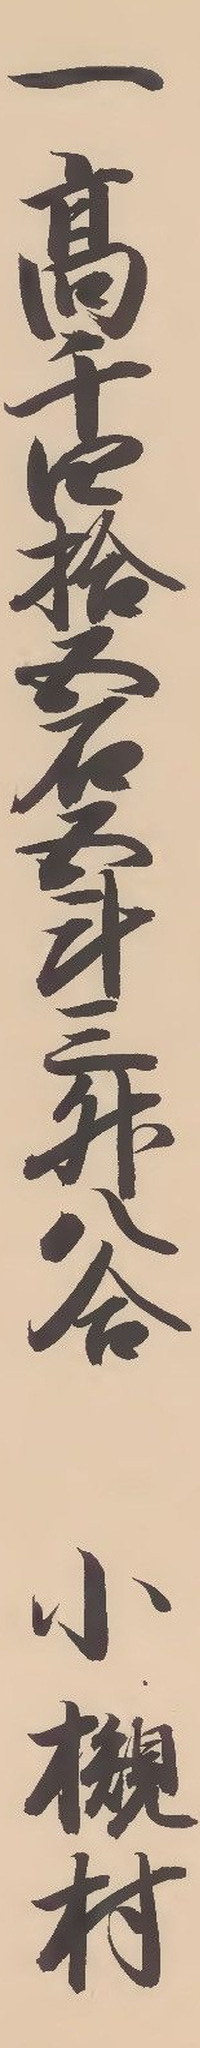一高千四拾五石五斗三升八合小槻村
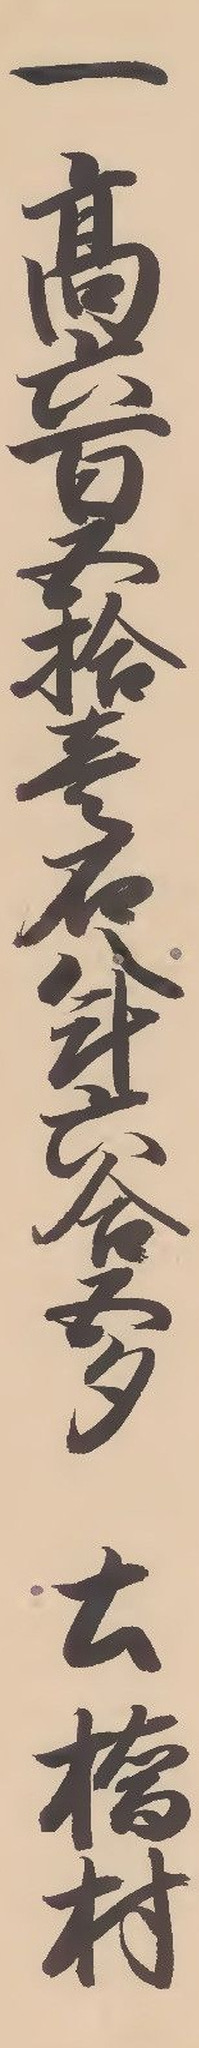一高六百五拾壱石八斗六合五勺土橋村

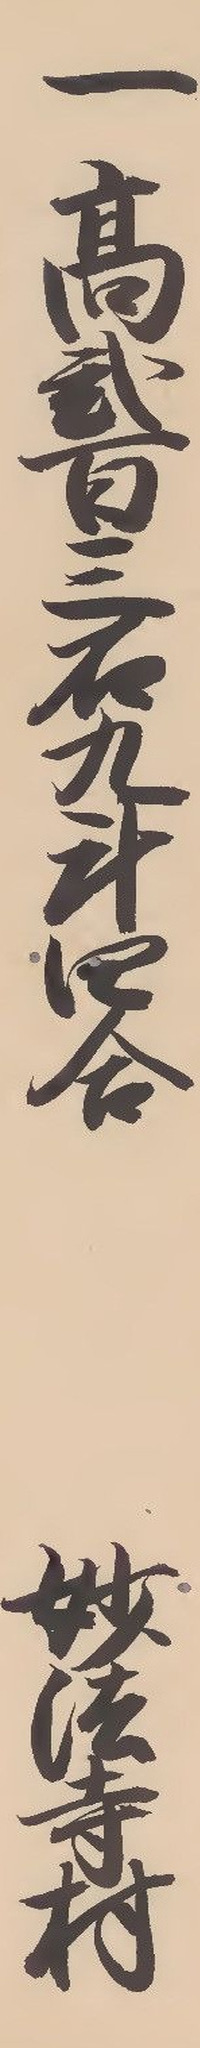一高弐百三石九斗四合妙法寺村
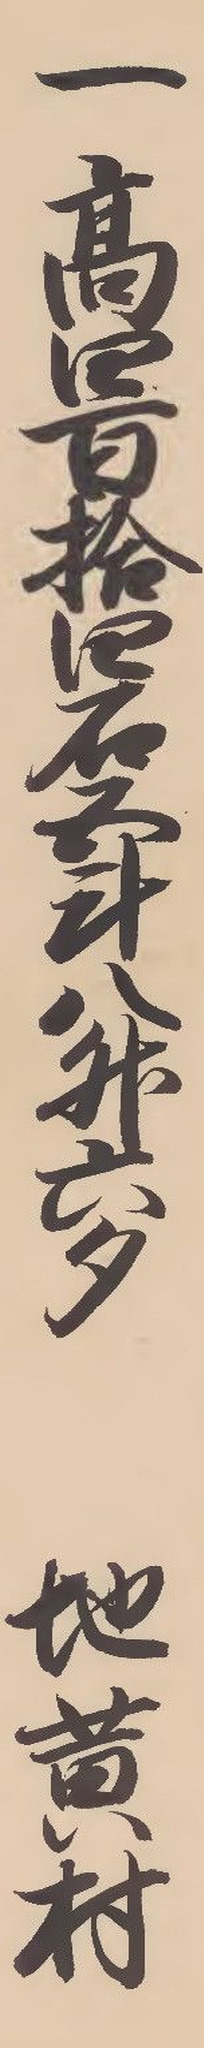一高四百拾四石五斗八升六勺地黄村
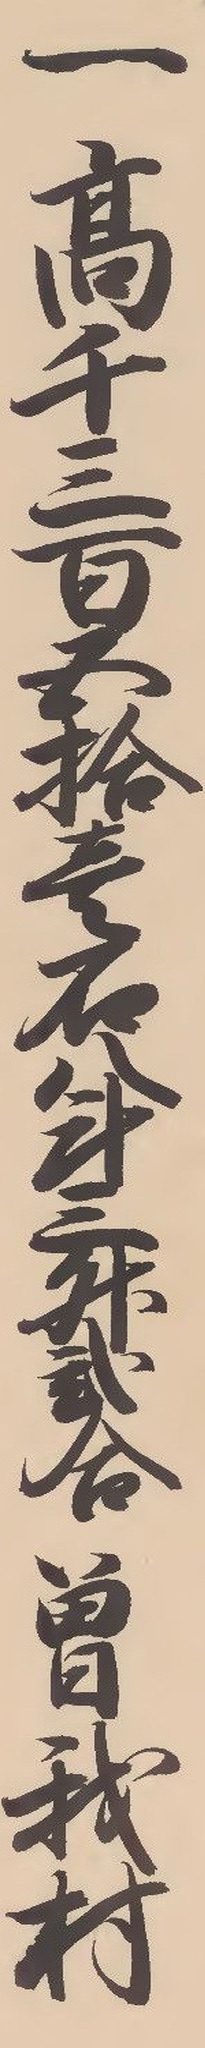一高千三百五拾壱石八斗三升弐合曽我村
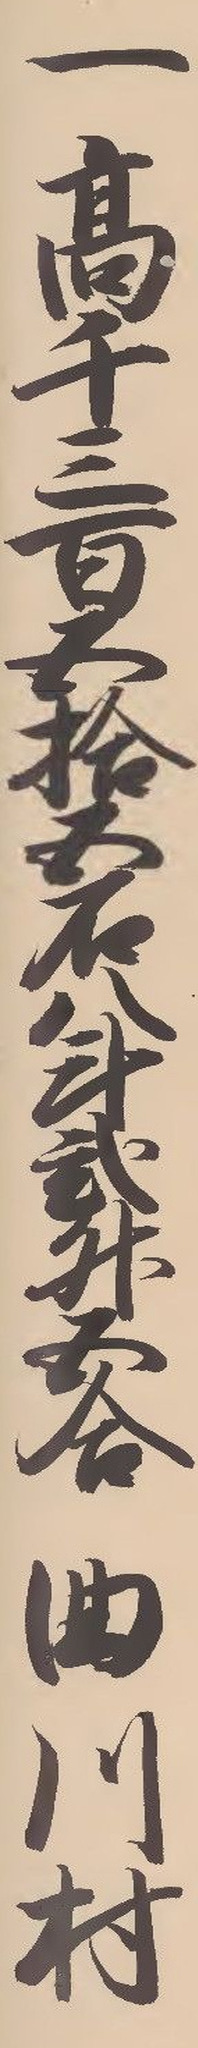一高千三百五拾五石八斗弐升五合曲川村
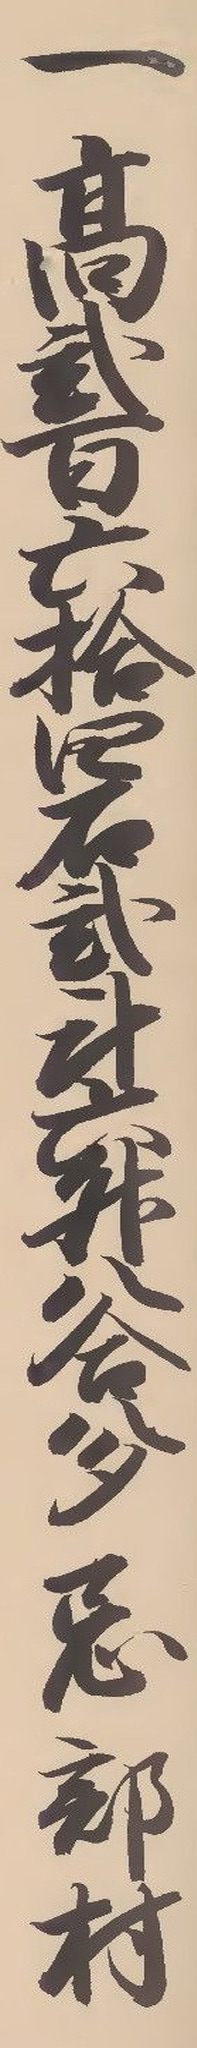一高弐百六拾四石弐斗六升八合八勺忌部村
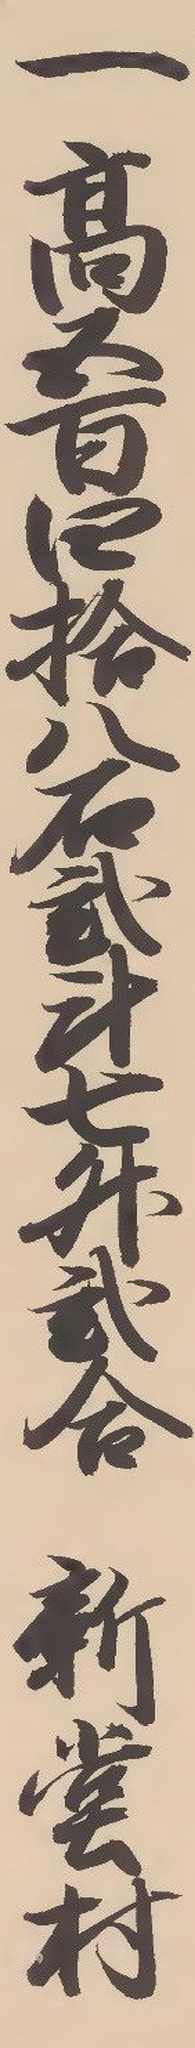一高五百四拾八石弐斗七升弐合新堂村
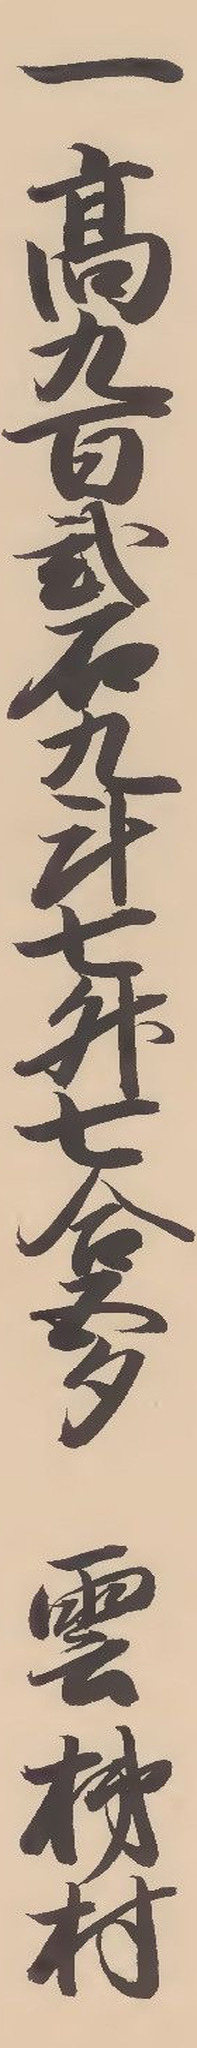一高九百弐石九斗七升七合五勺雲梯村
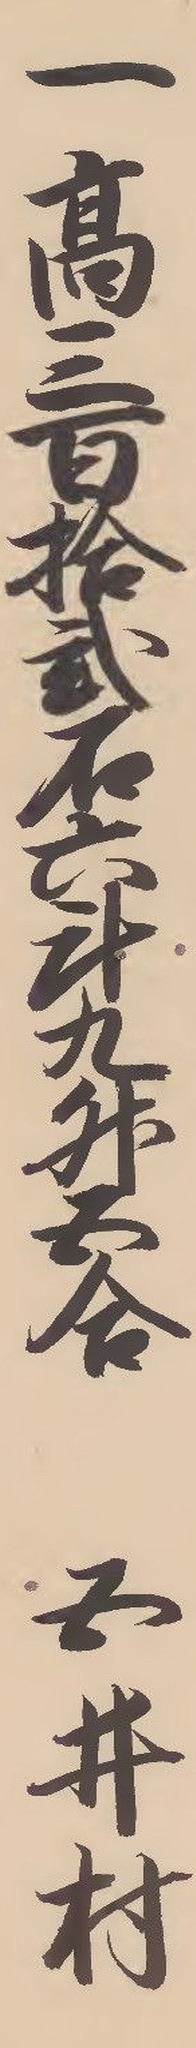一高三百拾弐石六斗九升五合五井村

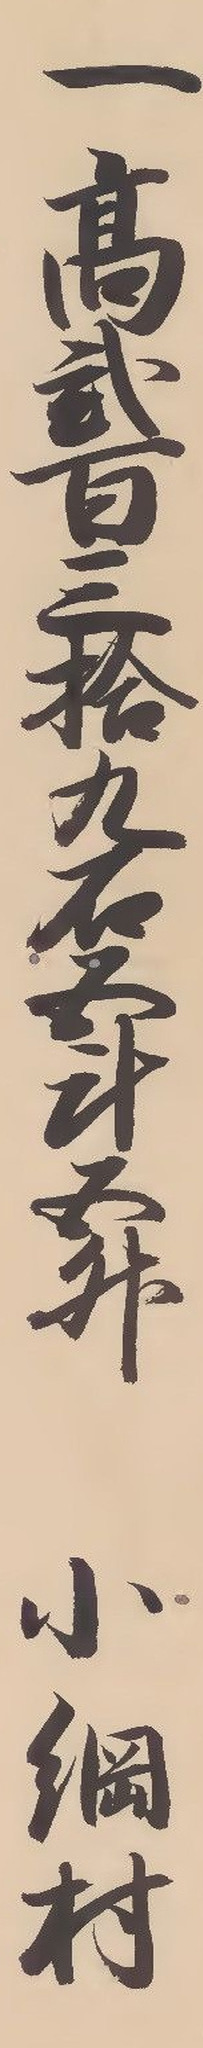一高弐百三拾九石五斗五升小綱村
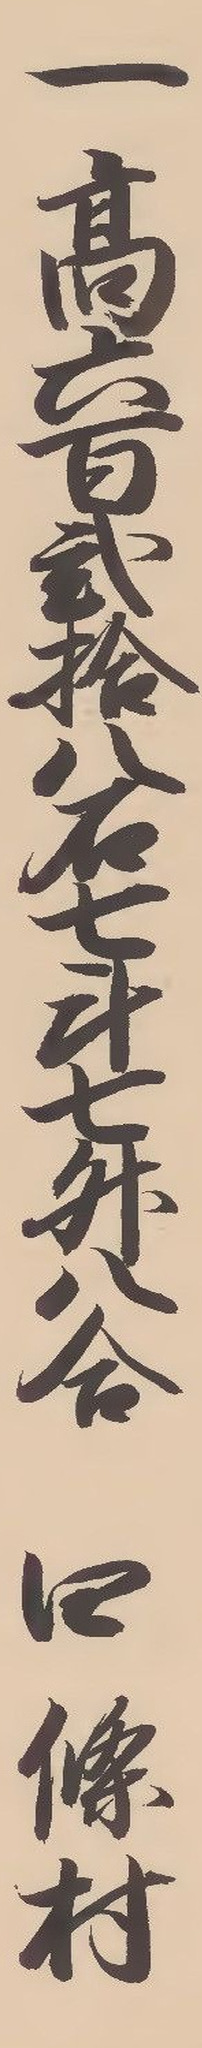一高六百弐拾八石七斗七升八合四条村
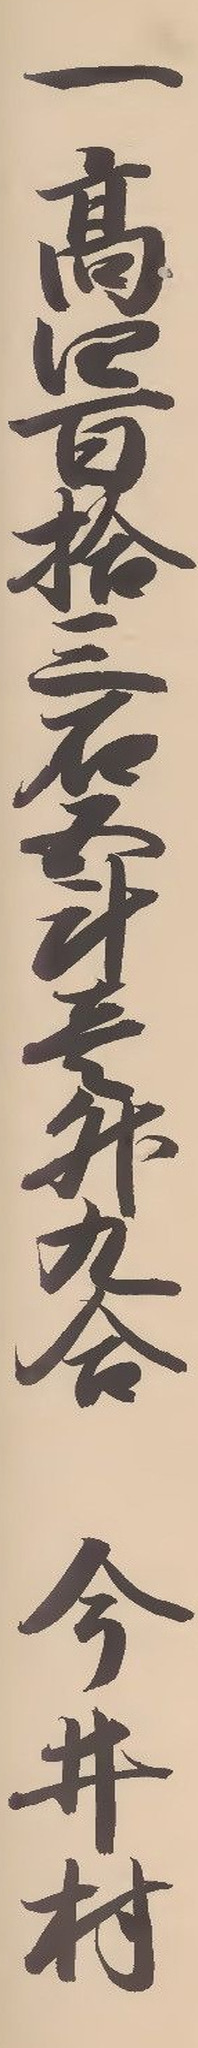一高四百拾三石五斗壱升九合今井村
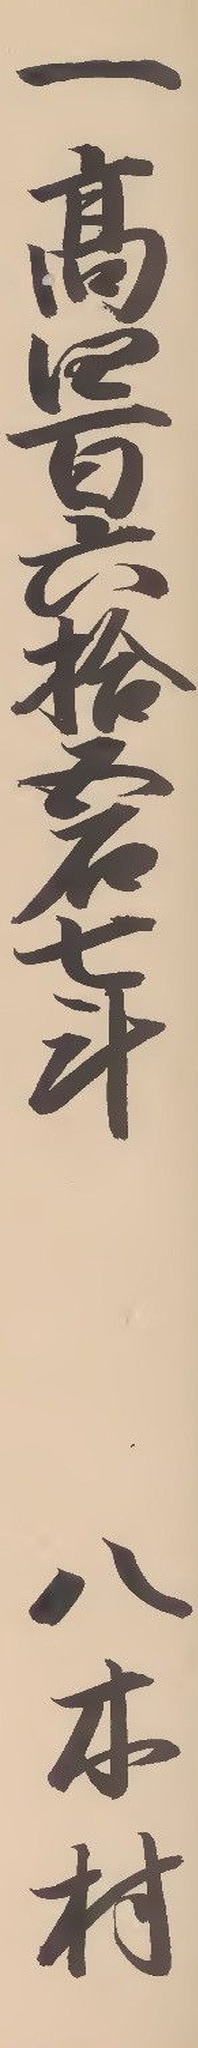一高四百六拾五石七斗八木村
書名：大和国郷帳
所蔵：国立公文書館 National Archives of Japan
